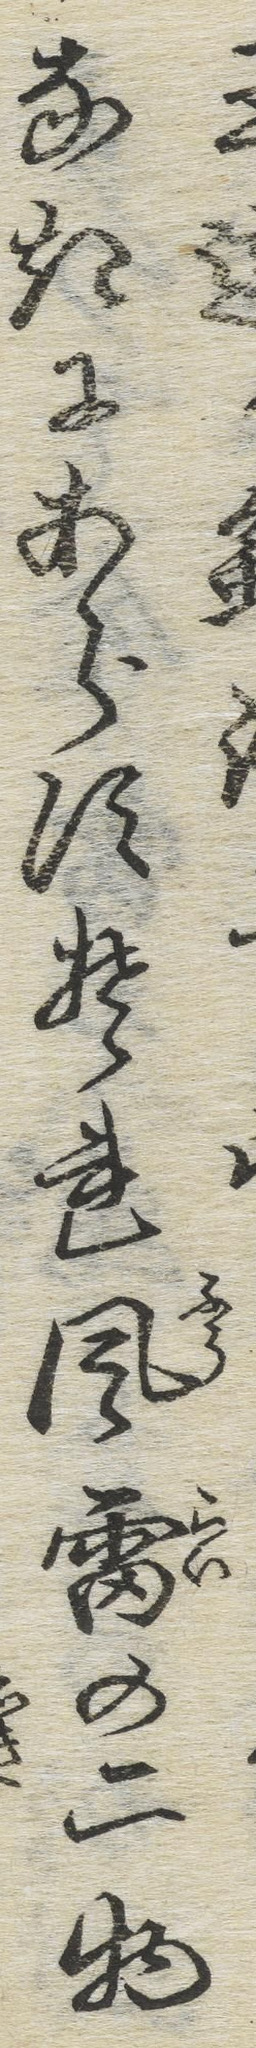なきにあらすそれ風雷の二物
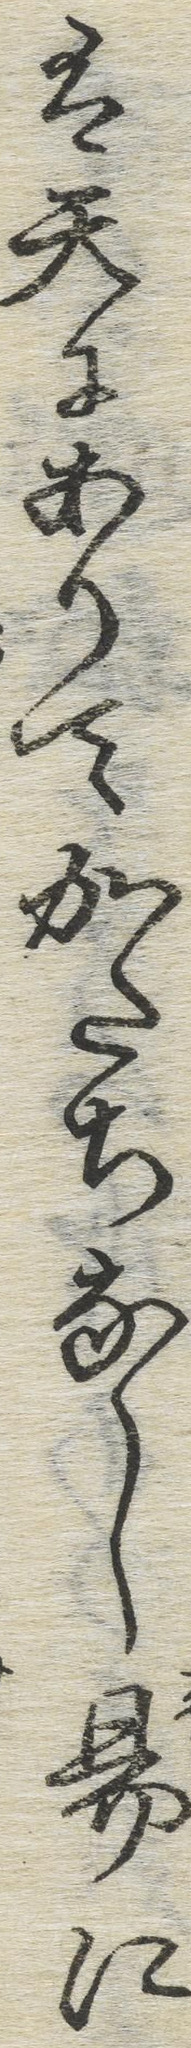は天にありてかたちなし易に
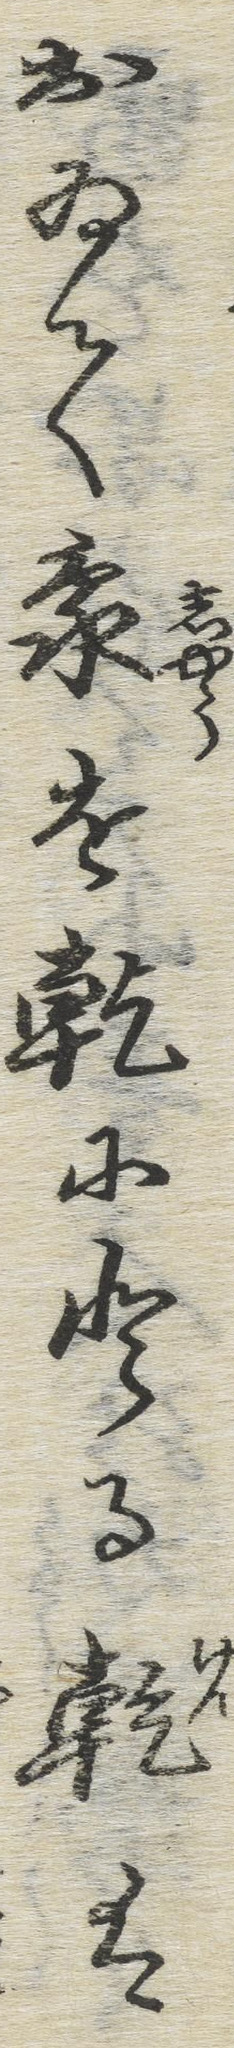おゐて象を乾にとる乾は
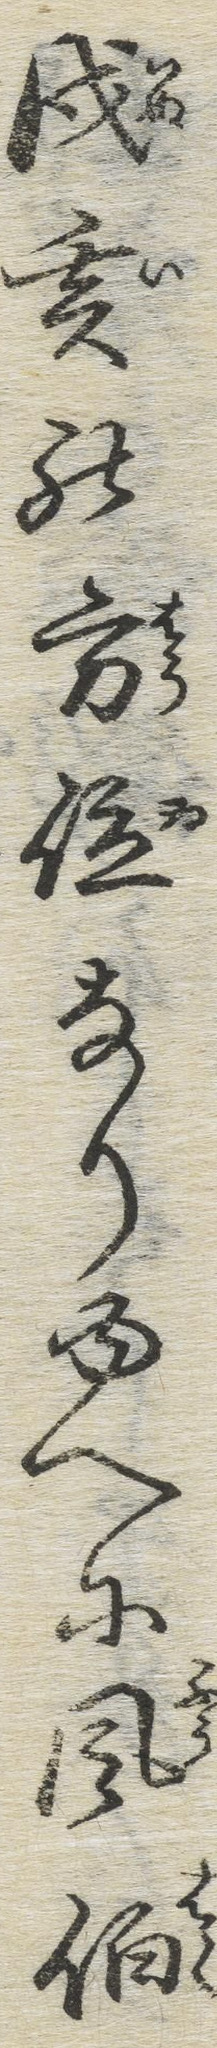戍亥の方位なりゆへに風伯
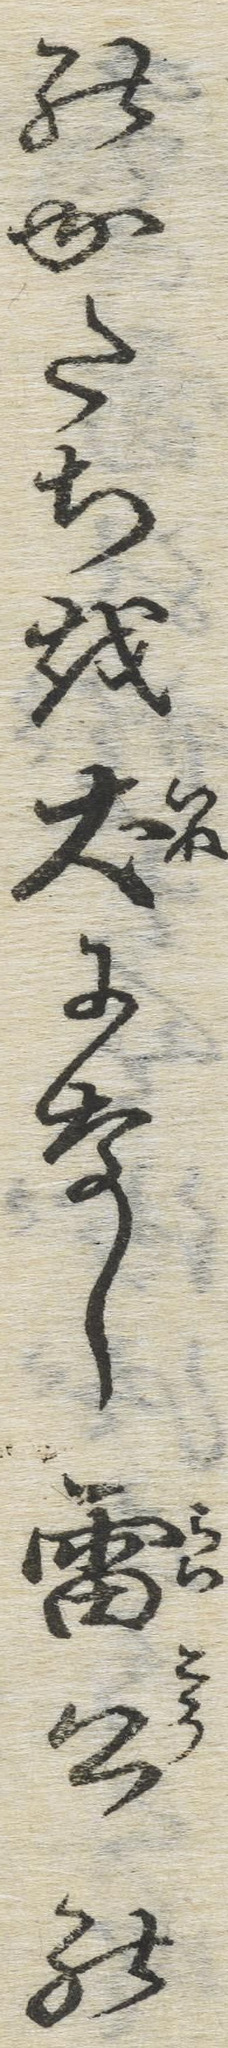のかたちを犬になし雷公の
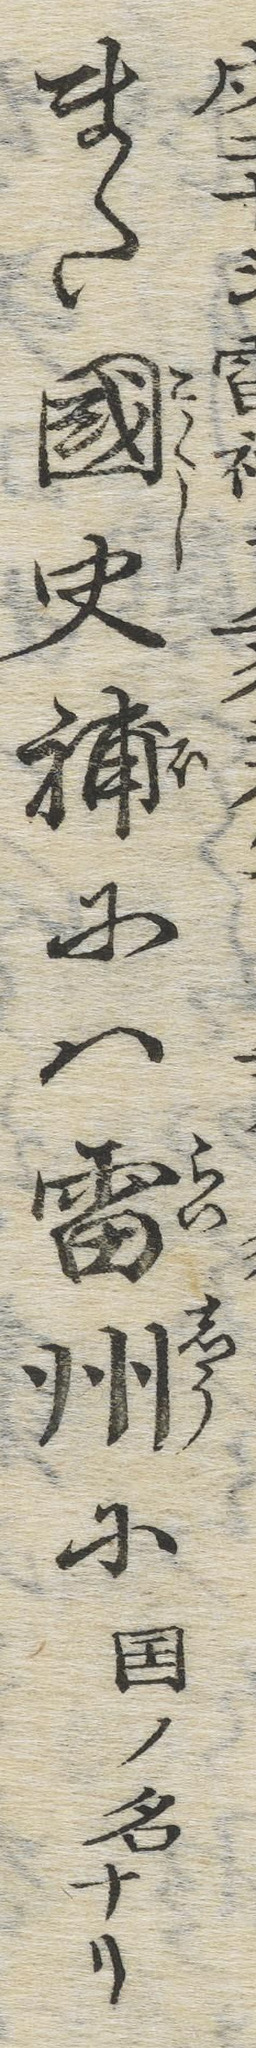また国史補には雷州に国ノ名ナリ
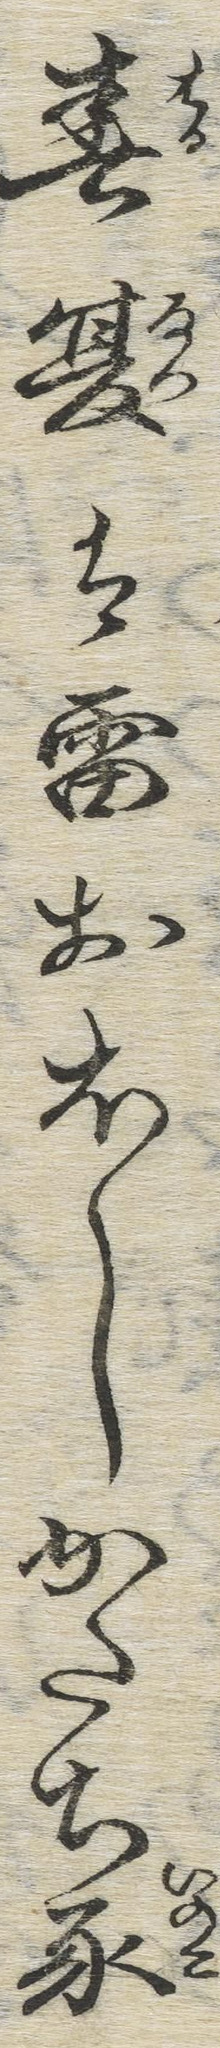春夏は雷おほしかたち豕
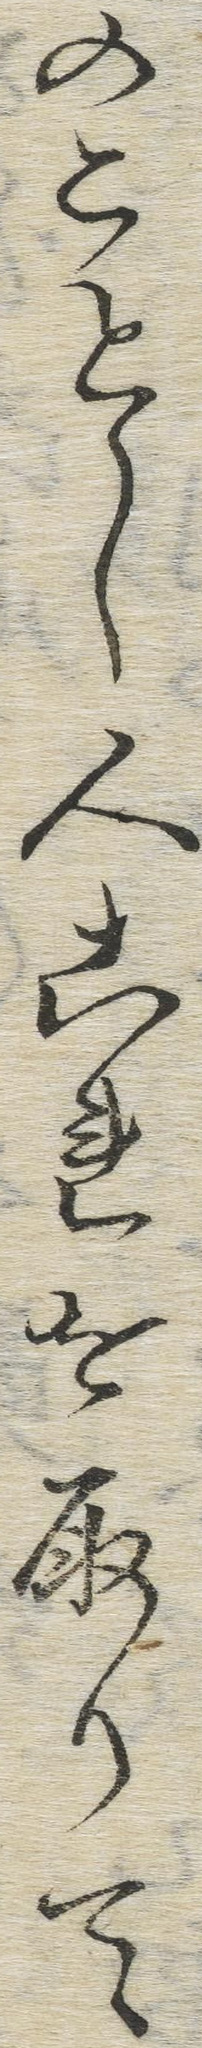のことし人これを取りて
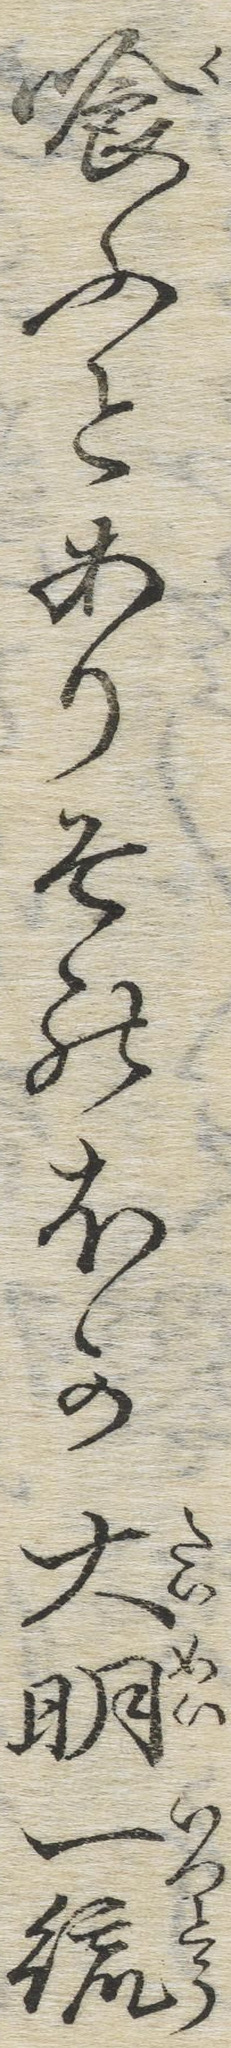喰ふとありそのほか大明一統
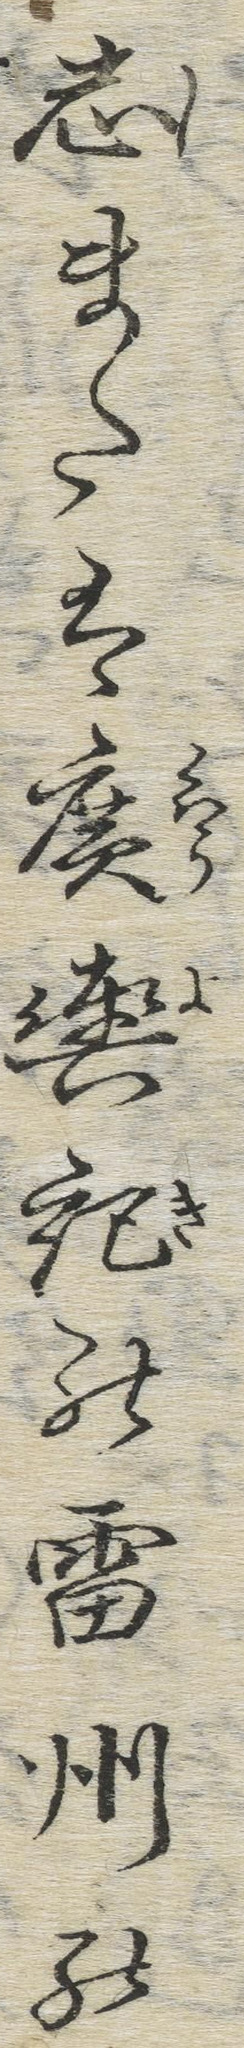志または廣輿記の雷州の
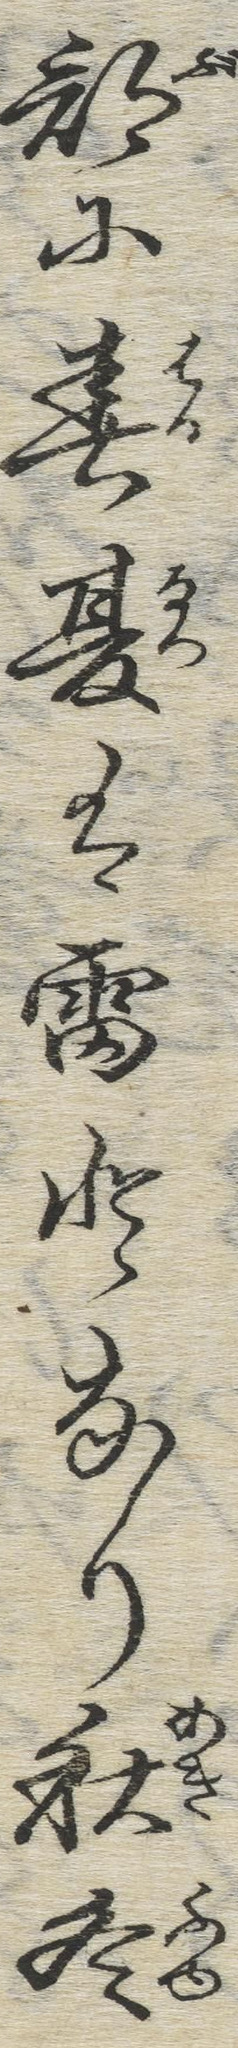部に春夏は雷となり秋冬
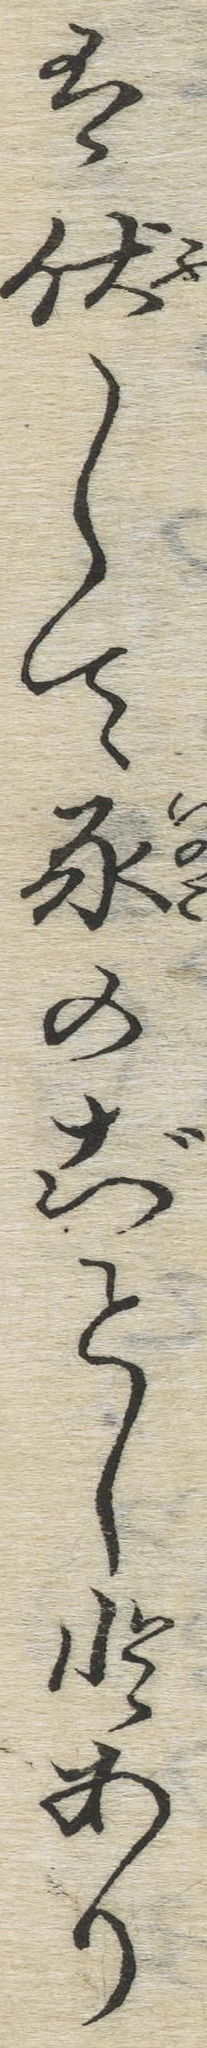は伏して豕のごとしとあり

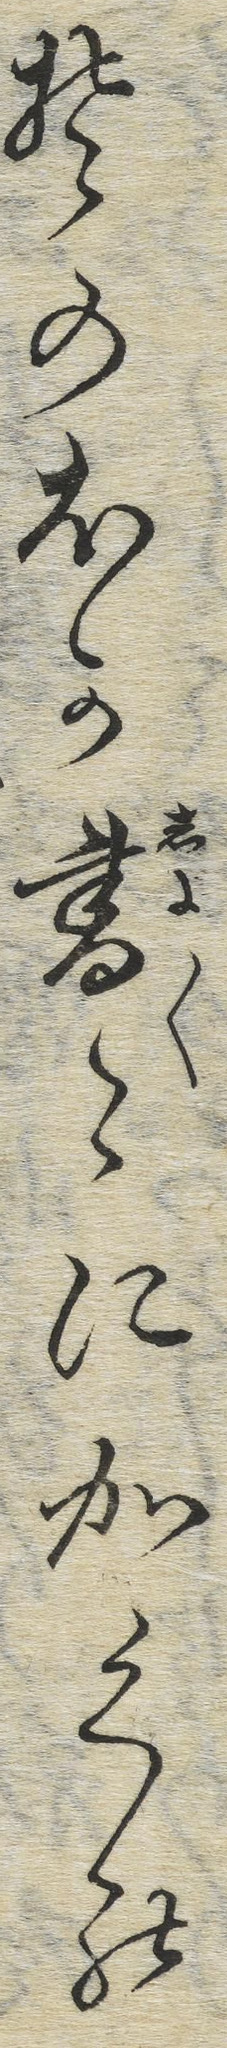そのほか書々にかくの
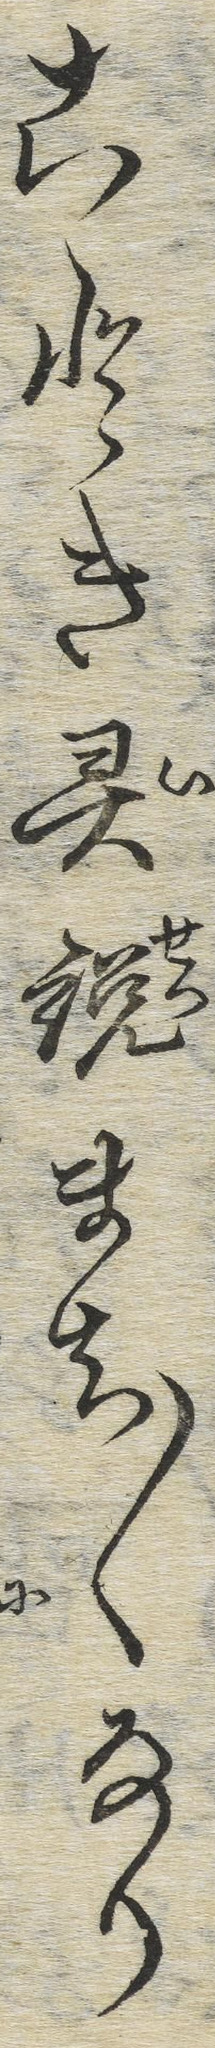ことき異説まち〳〵なり
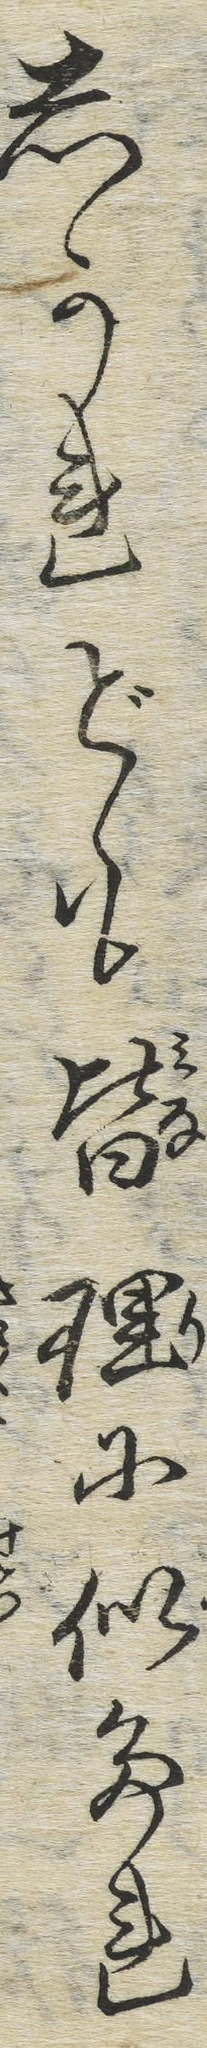しかれども皆理に似たれ
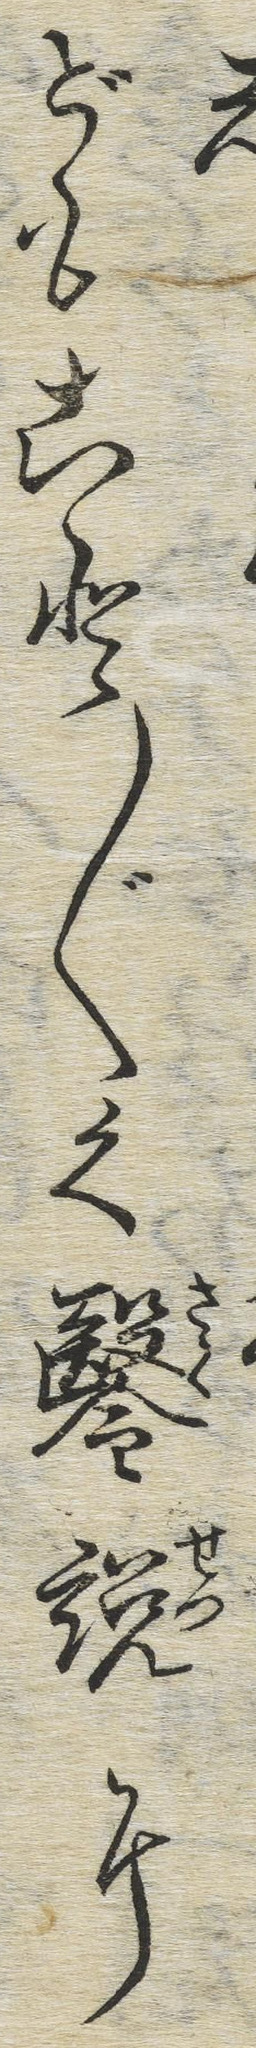どもこと〴〵く鑿説に
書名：雷公地震由來記　全
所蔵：東京大学地震研究所図書室 Earthquake Research Institute Library, The University of Tokyo, JAPAN
